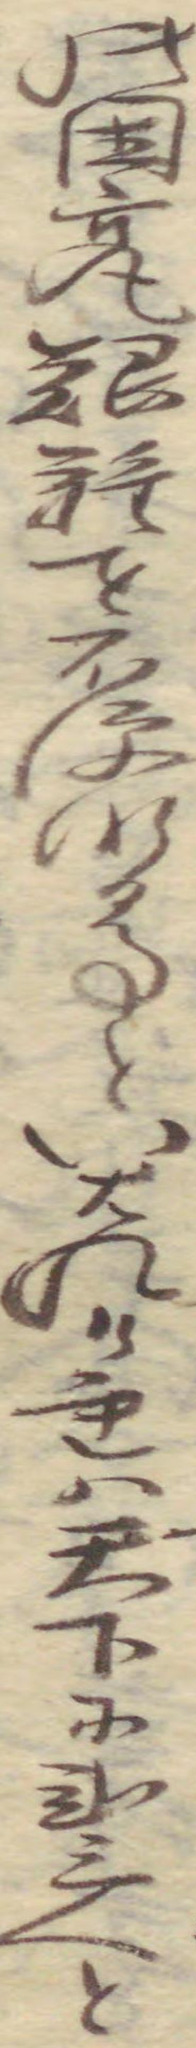の困窮艱難を不便なる事といはれけれは天下に弐三人と
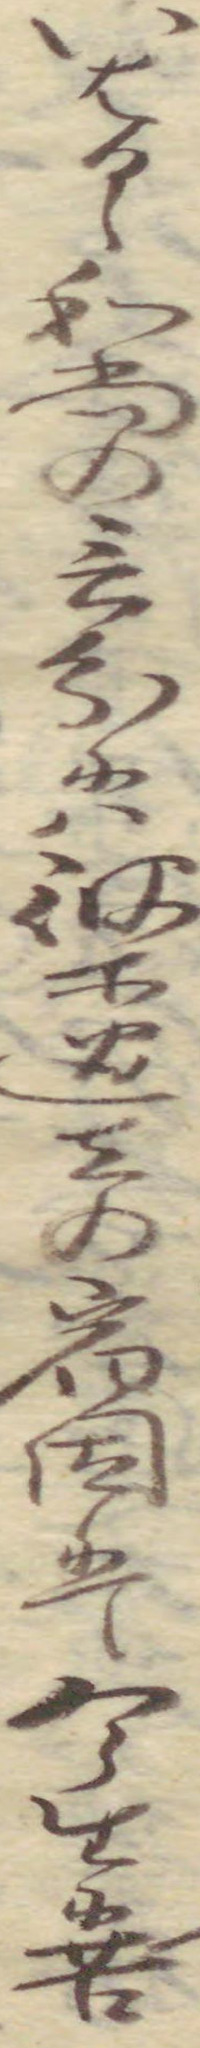いはるゝ和尚の言分には彼等過去の宿因にて今生に苦
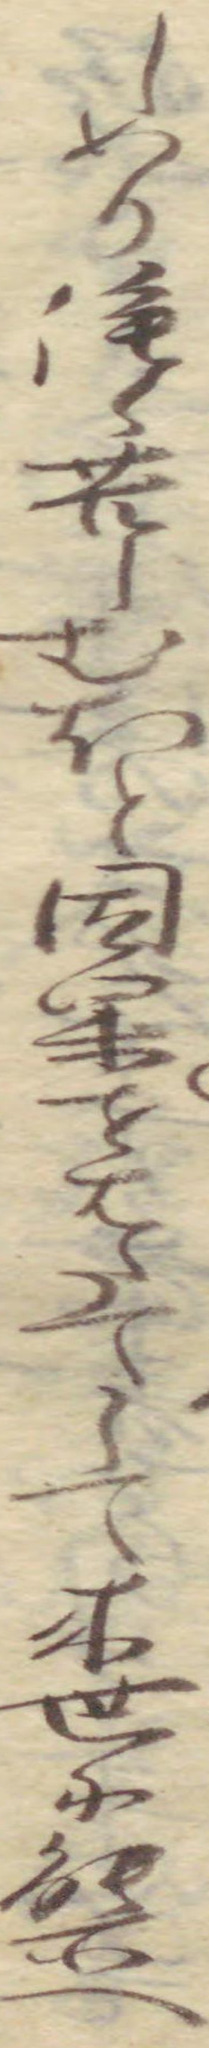しめり強く苦しむほと因果をはたてして来世に能所へ
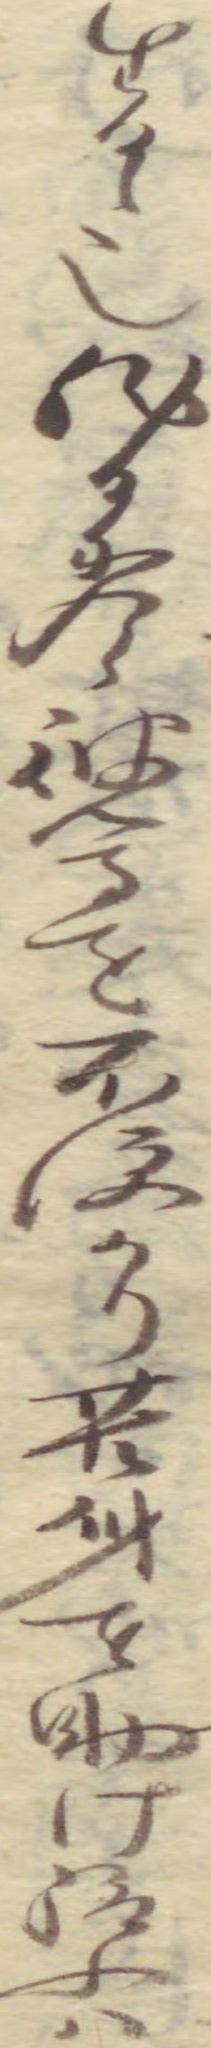生るゝ也然るに今彼等を不便かり苦身を助け給ふは
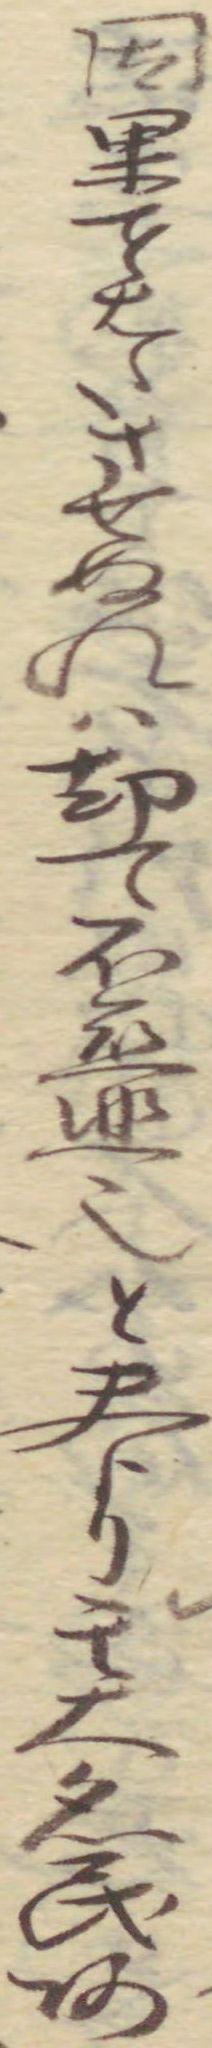因果をはたさせぬれは却て不慈悲也と夫より其大名民あ
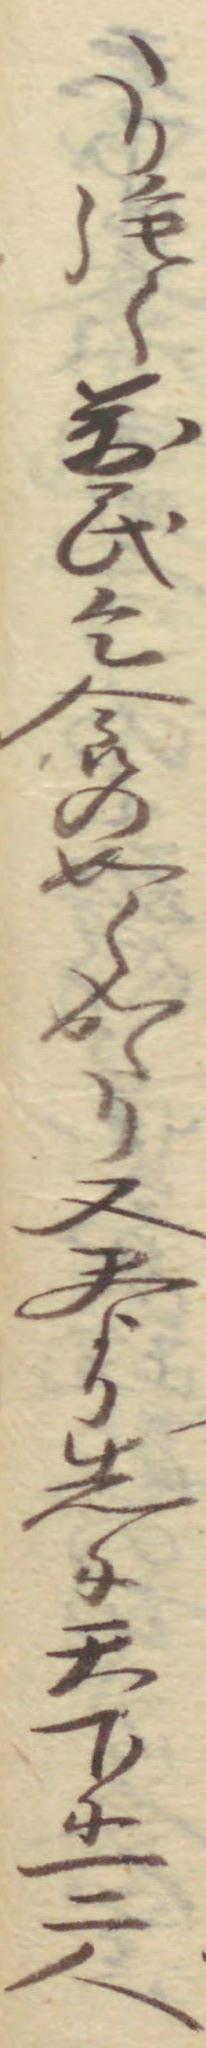たり強く万民乞食の如く成たり又夫より先に天下に一二人
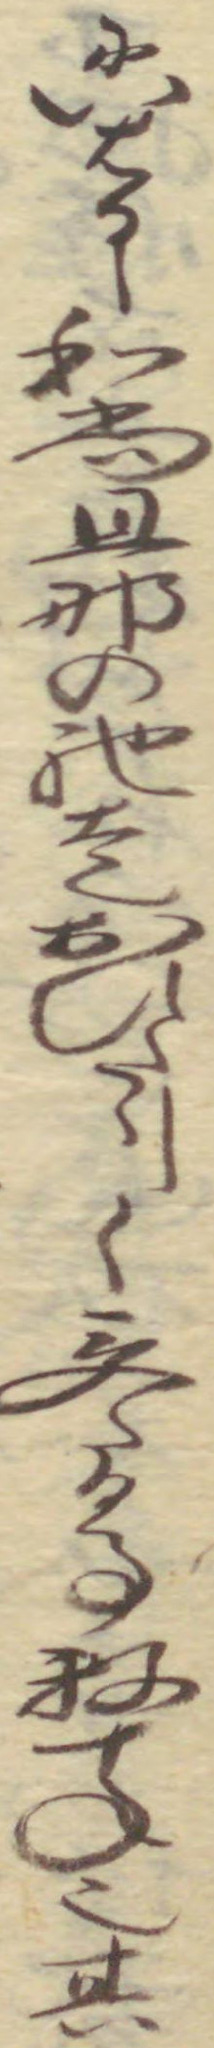にいはるゝ和尚旦那の馳走おひたゝしく受たる事数十年也其
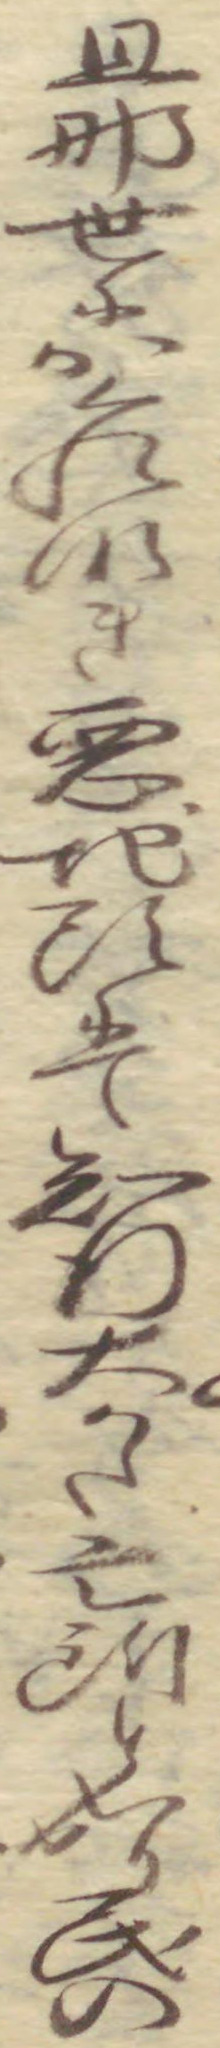旦那世にかくれなき悪地頭にて知行大かた亡所と成り民の
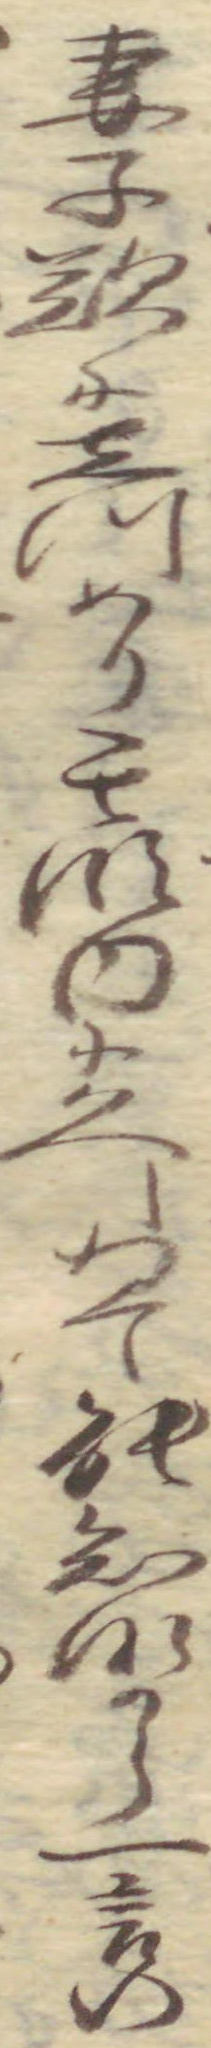妻子歎にしつめり其領内に久しゐて能知なから一言の
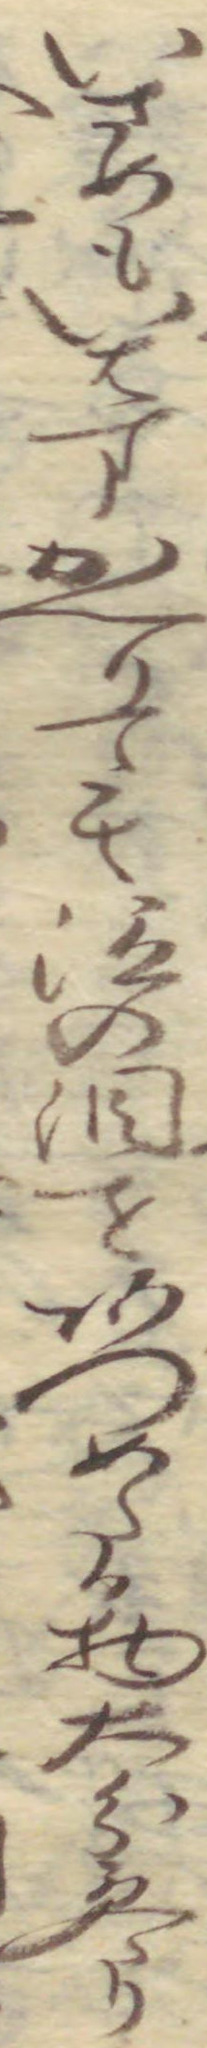いさめもいはすかへりて其泣の泪をあつめたる者大分受たり
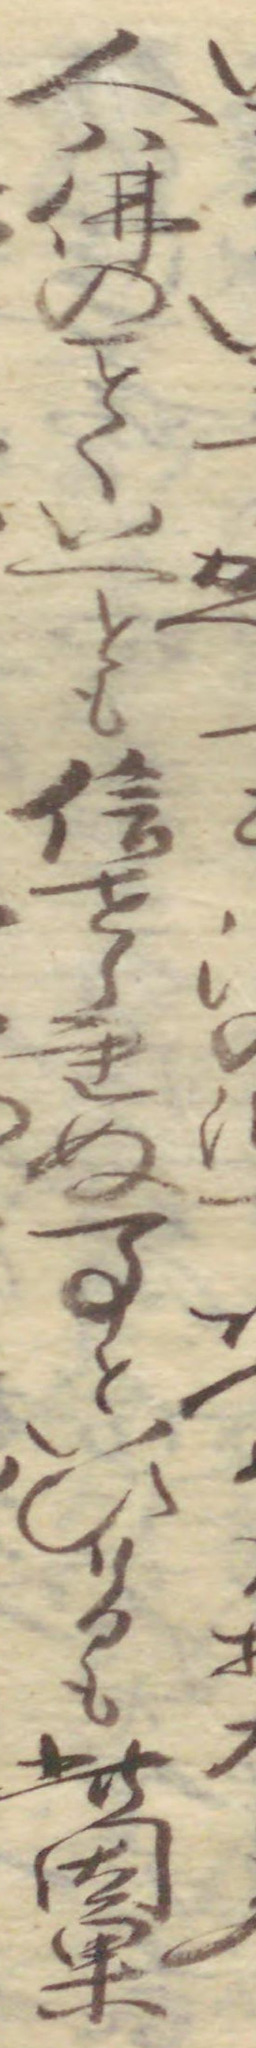人は仏のことくいへとも信せられぬ事といひけるも此因果
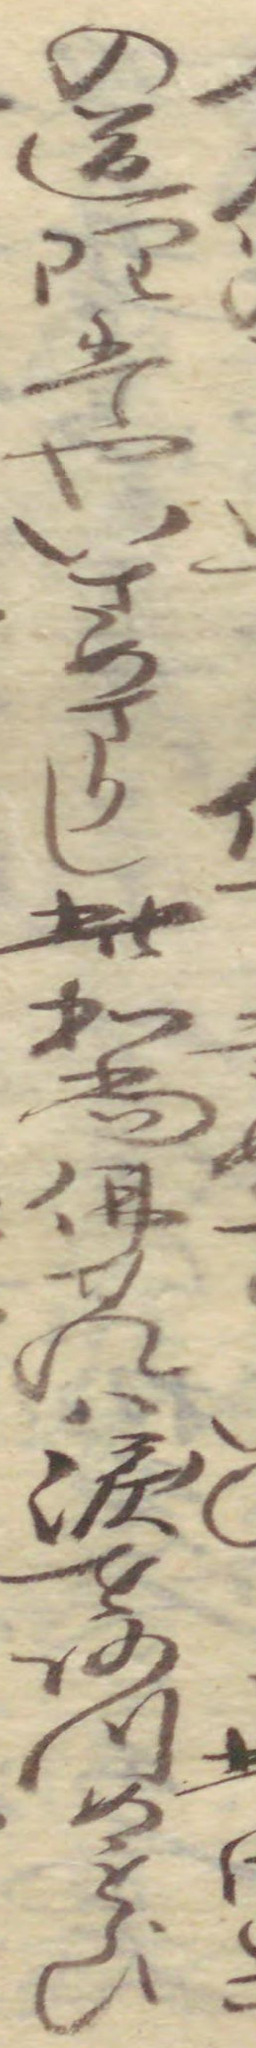の道理にてやいさめさりし此和尚仏なれは涙をあつめもらひ
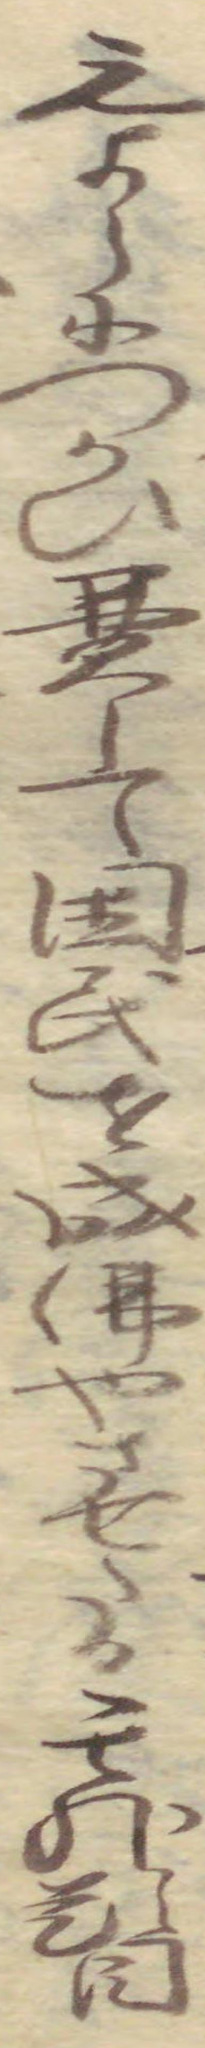えようにつかひ費して困民を成仏やさせたる其外題目
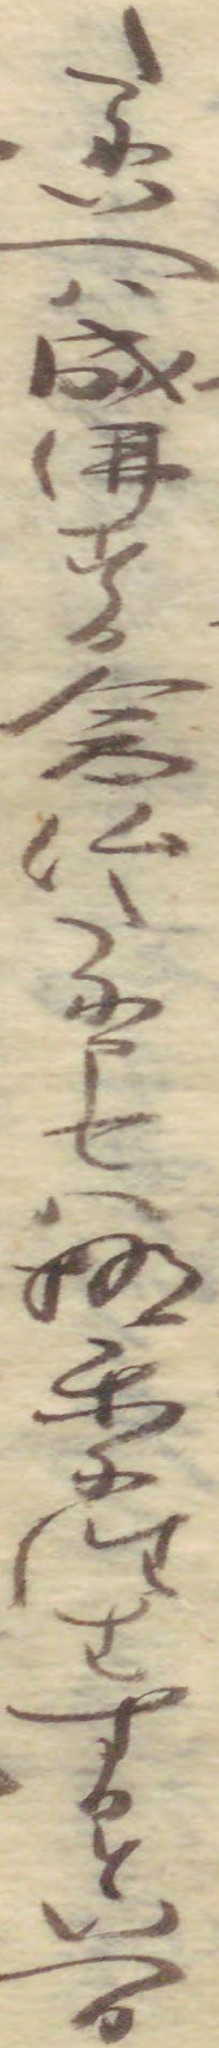たにいへは成仏する念仏たに申せは極楽に往生するといへる
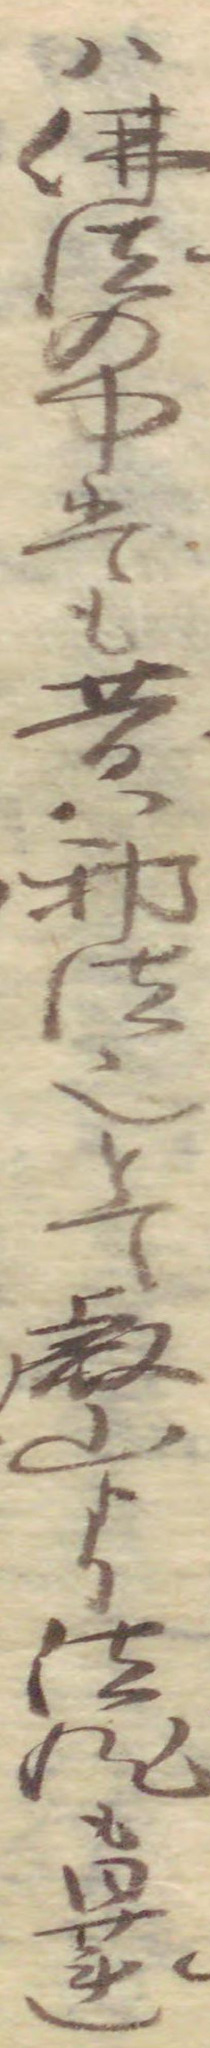は仏法の中にても昔は邪法也とて叡山より法然も日蓮
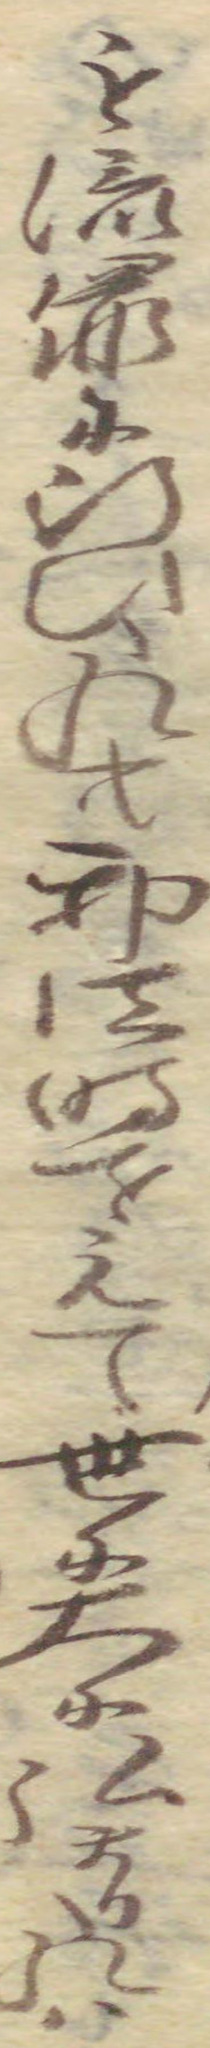も流罪に行ひたれ共邪法時をえて世に大に弘まりたれは
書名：鶯宿雑記. 巻263-264
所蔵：国立国会図書館 National Diet Library, JAPAN
